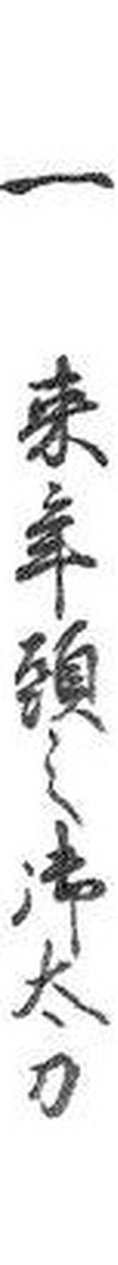一来年頭之御太刀
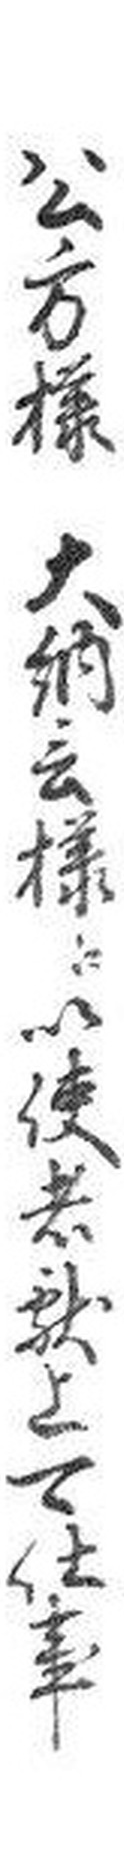公方様大納言様江以使者献上可仕事
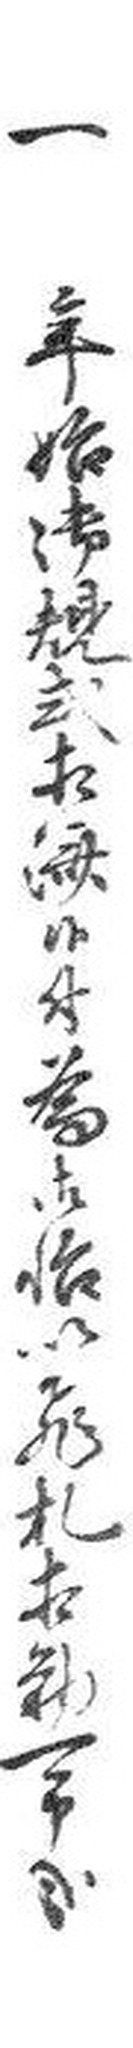一年始御規式相済候付為御怡以飛札相勤可申哉
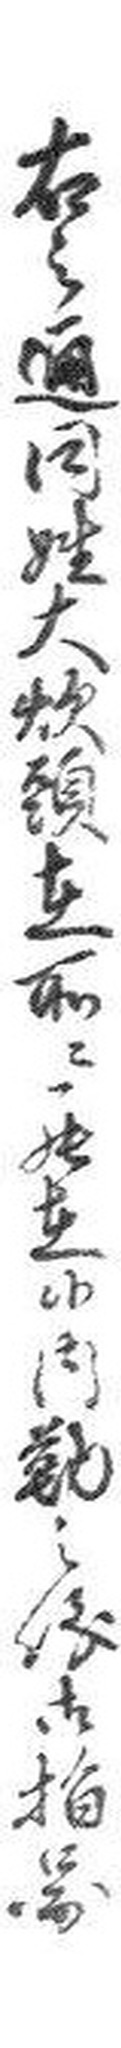右之通同姓大炊頭在所ニ罷在候内勤之儀御指図
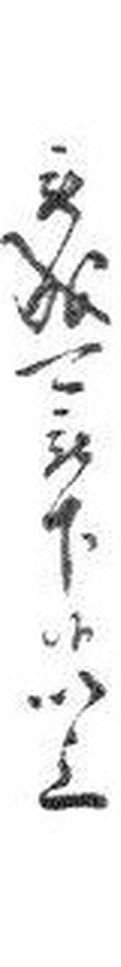被成可被下候以上
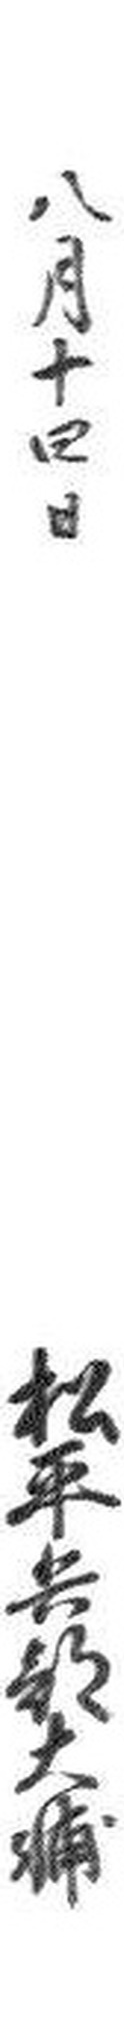八月十四日松平兵部大輔
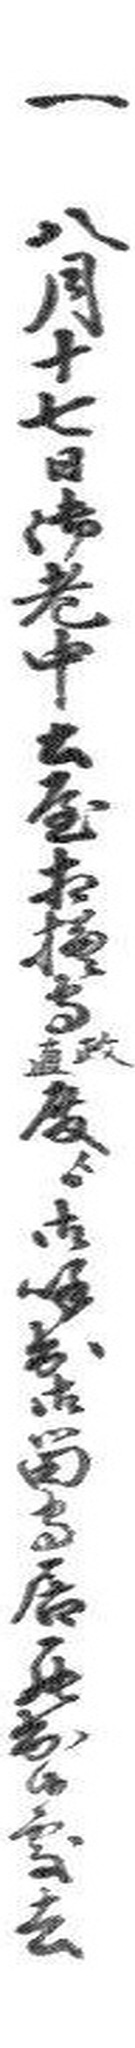一八月十七日御老中土屋相模守政直殿ゟ御呼出御留守居罷出候処去
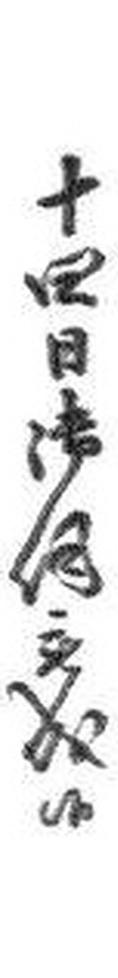十四日御伺被成候
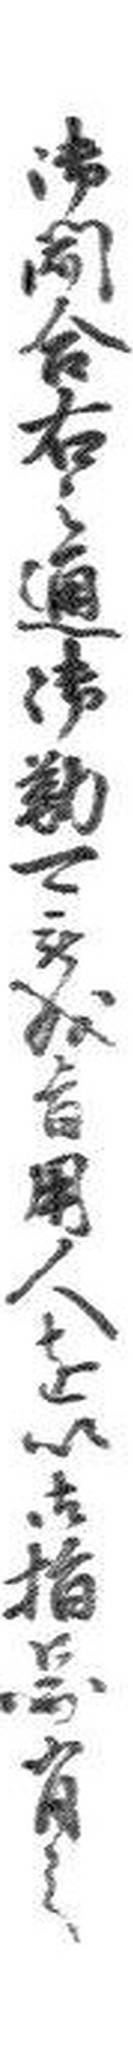御聞合右之通御勤可被成旨用人を以御指図有之
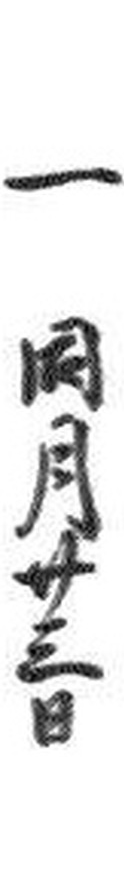一同月廿三日
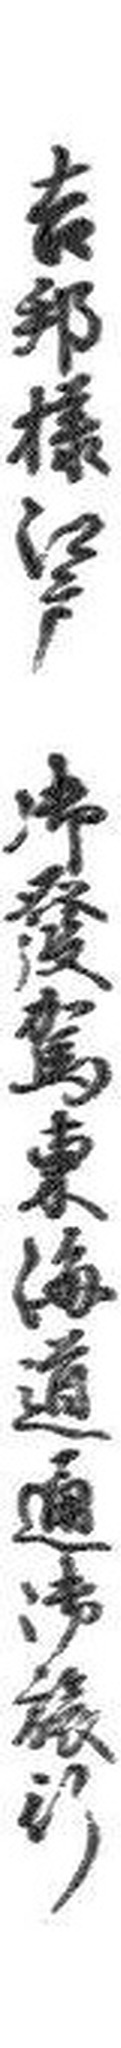吉邦様江戸御発駕東海道通御旅行
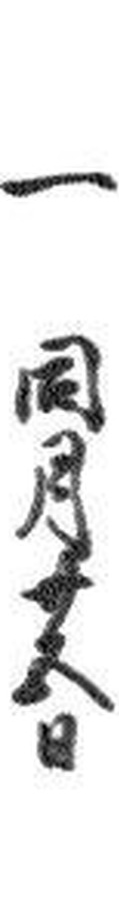一同月廿三日
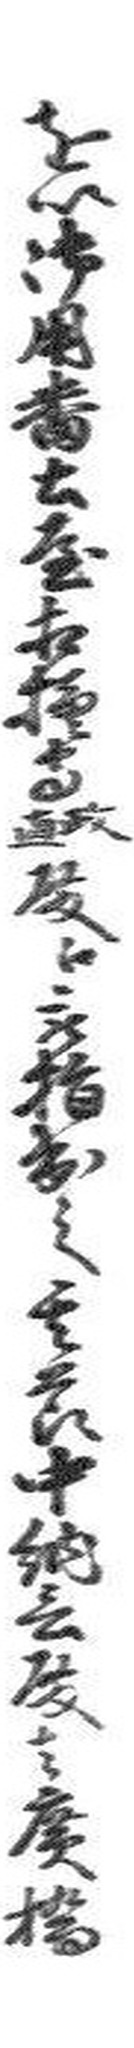を以御用番土屋相模守政直殿江被指出之其節中納言殿者広橋

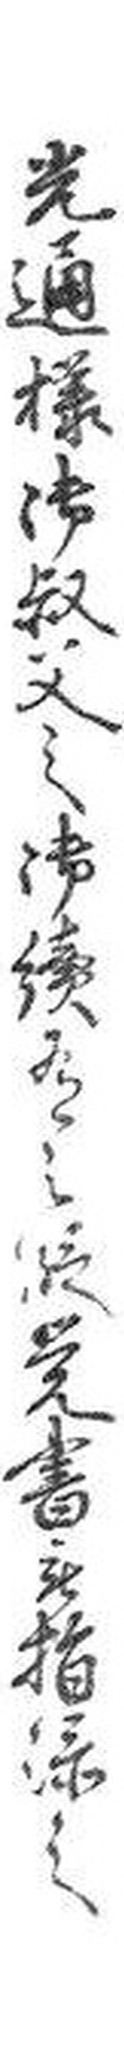光通様御叔父之御続有之段覚書被指添之
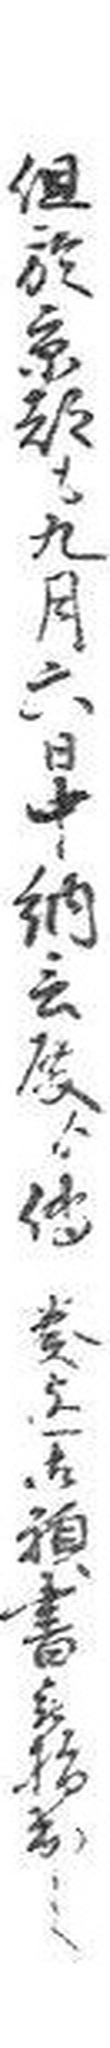但於京都も九月六日中納言殿ゟ伝奏迄御願書被指出之
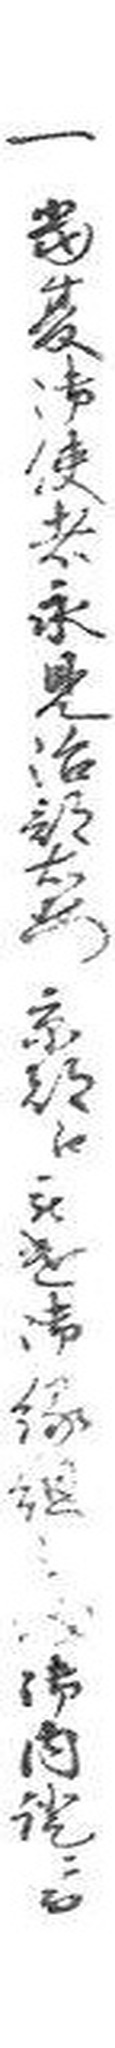一当夏御使者永見治部右衛門京都江被遣御縁組之儀御内証ニ而
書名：家譜 二十四 吉品公 従宝永三年到同五年
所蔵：福井県文書館 Fukui Prefectural Archives
